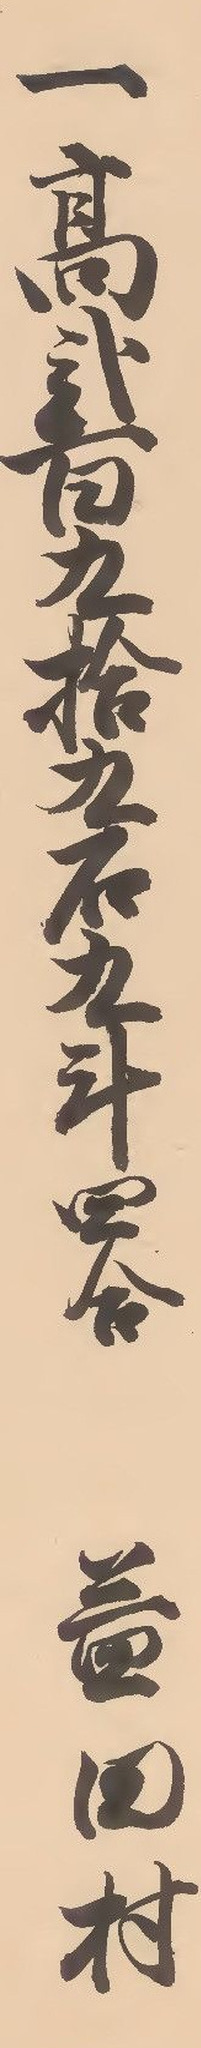一高弐百九拾九石九斗四合益田村
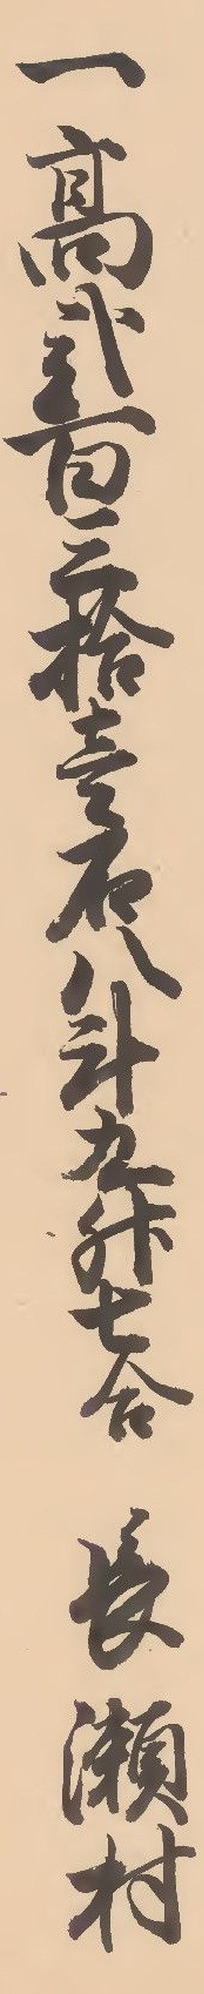一高弐百三拾壱石八斗九升七合長瀬村

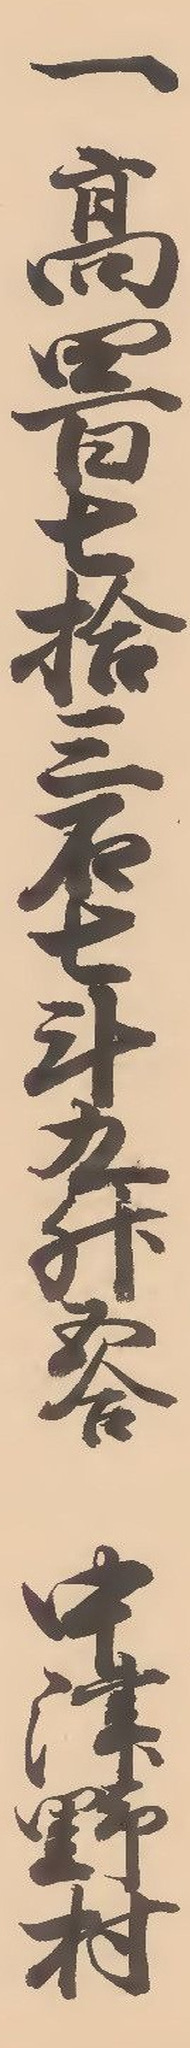一高四百七拾三石七斗九升五合中津野村
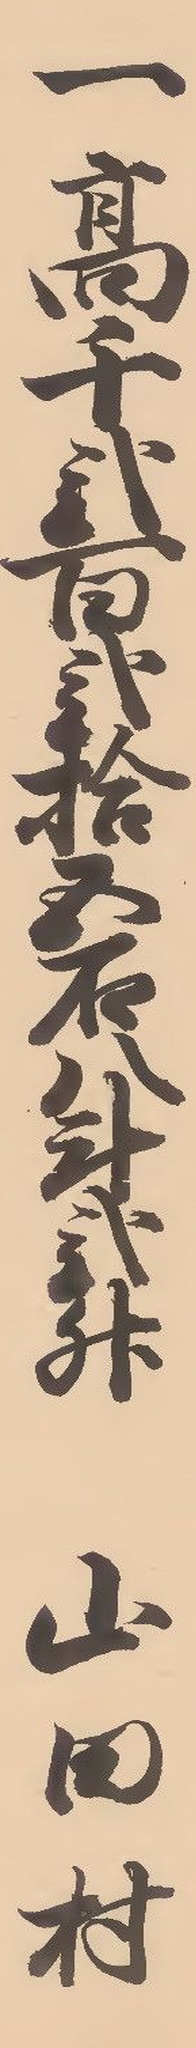一高千弐百弐拾五石八斗弐升山田村
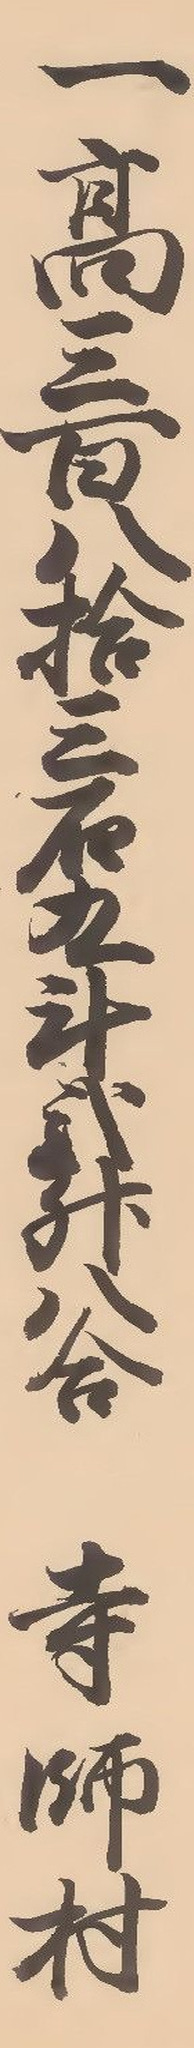一高三百八拾三石九斗弐升八合寺師村
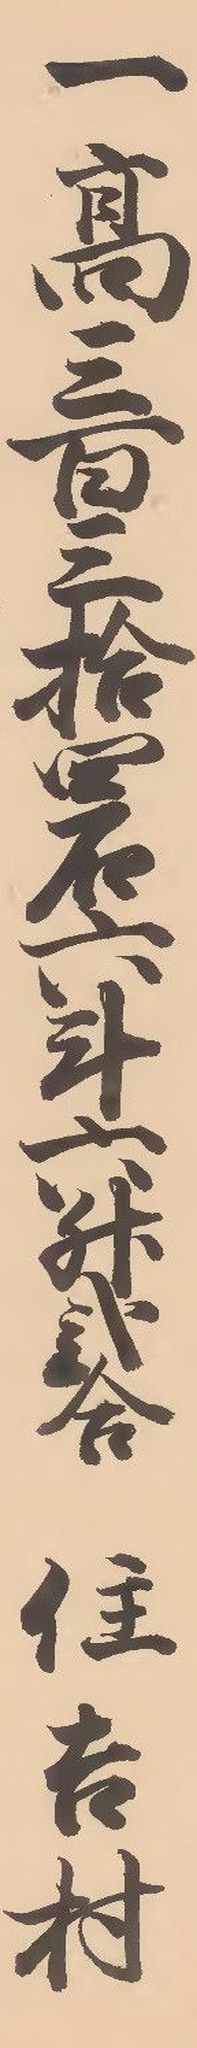一高三百三拾四石六斗六升弐合住吉村
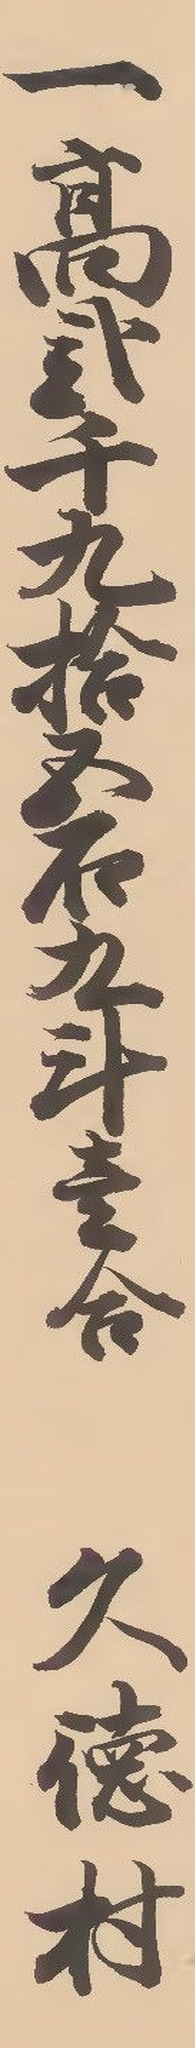一高弐千九拾五石九斗壱合久徳村
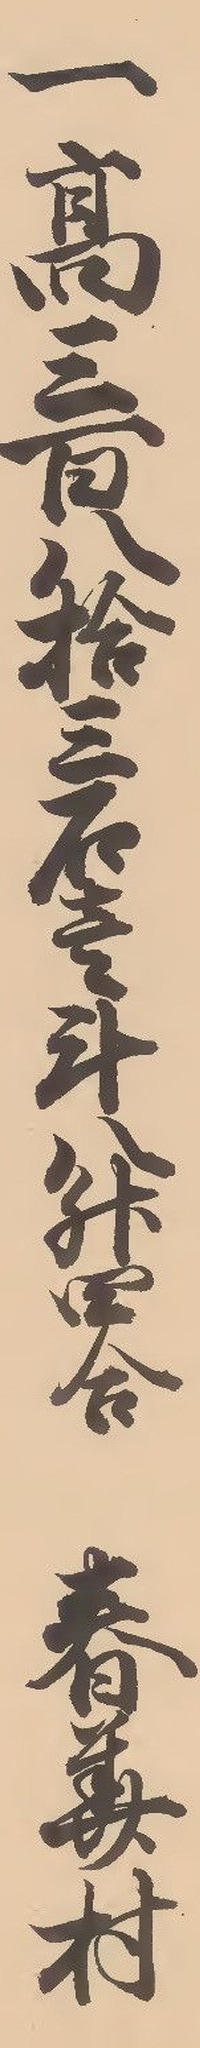一高三百八拾三石壱斗八升四合春華村
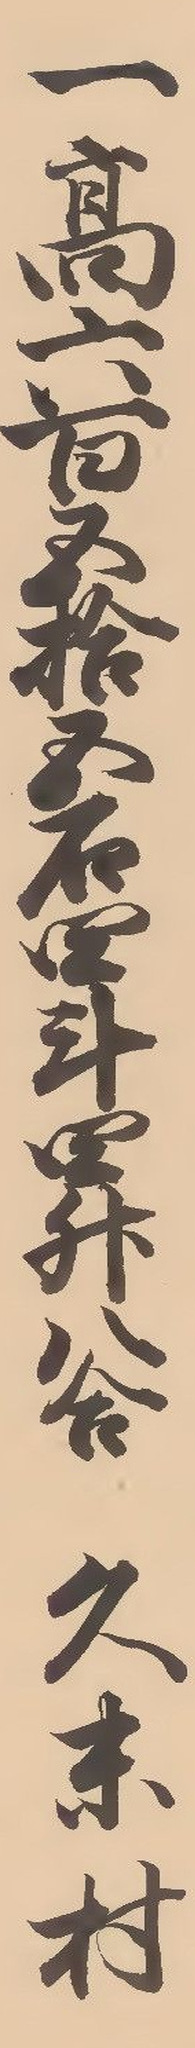一高六百五拾五石四斗四升八合久末村
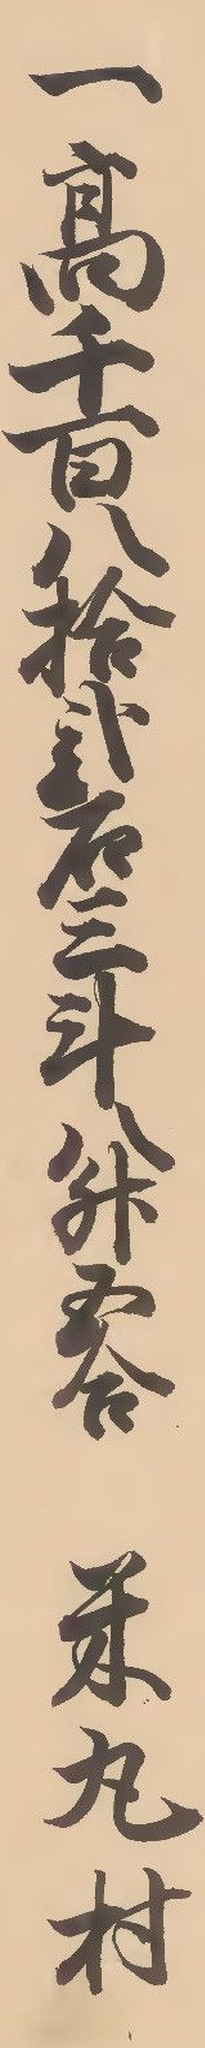一高千百八拾弐石三斗八升五合米丸村

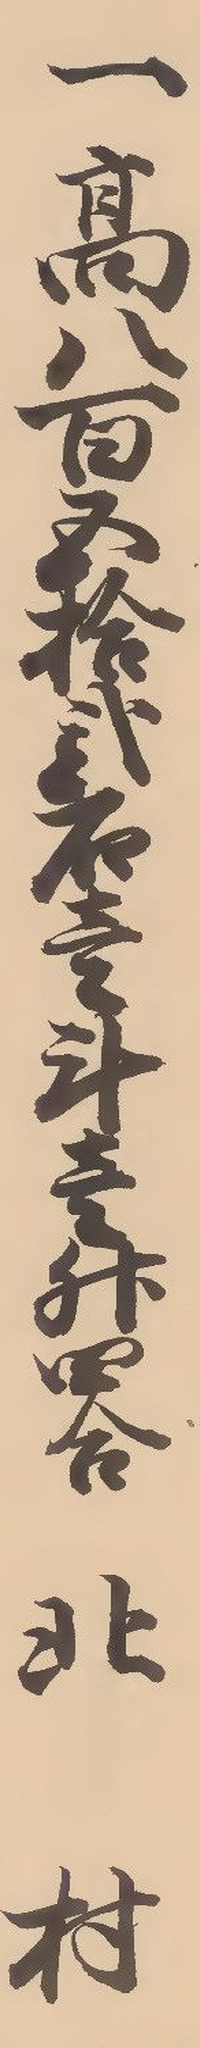一高八百五拾弐石壱斗壱升四合北村
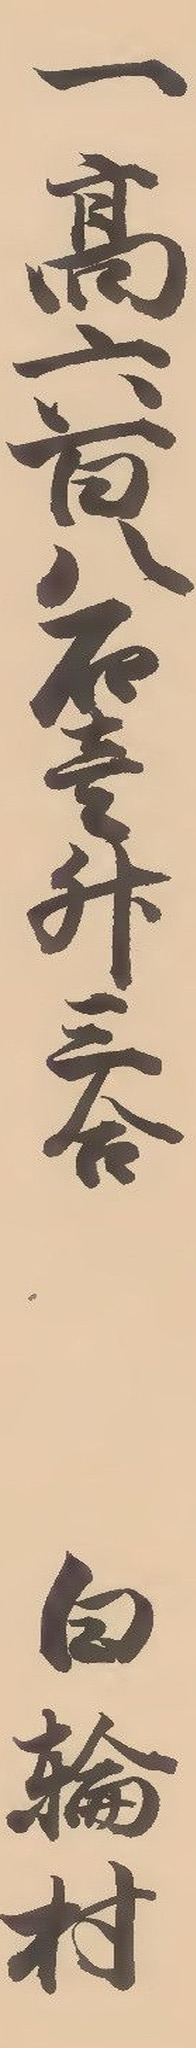一高六百八石壱升三合白輪村
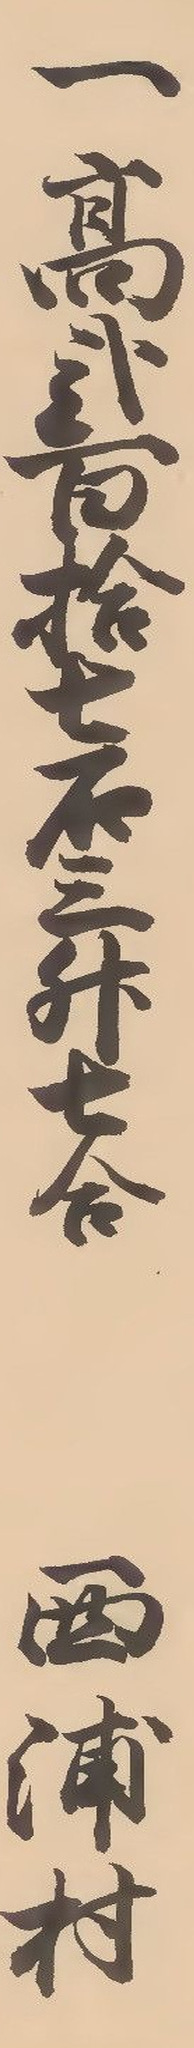一高弐百拾七石三升七合西浦村
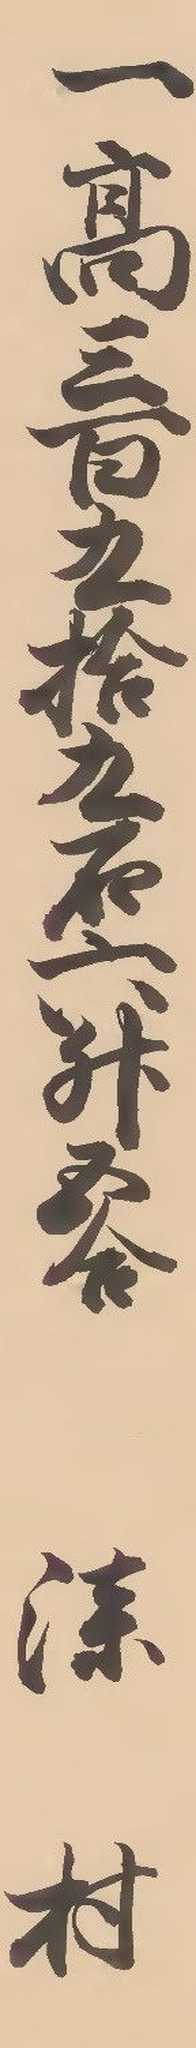一高三百九拾九石六升五合漆村
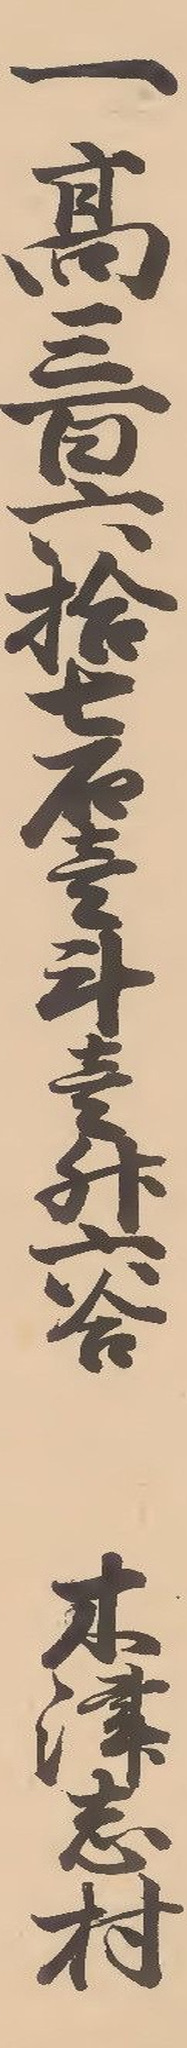一高三百六拾七石壱斗壱升六合木津志村
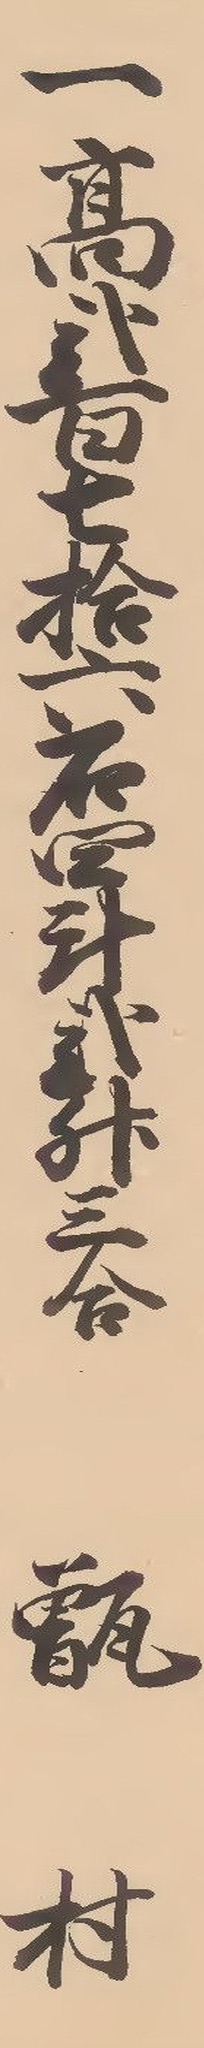一高弐百七拾六石四斗弐升三合甑村
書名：大隅国郷帳
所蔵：国立公文書館 National Archives of Japan
